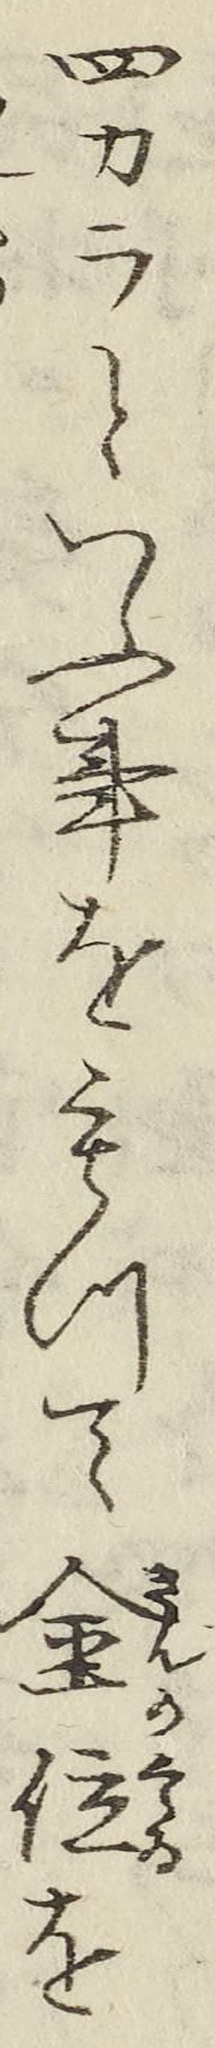四カラといふ事をもつて金位を
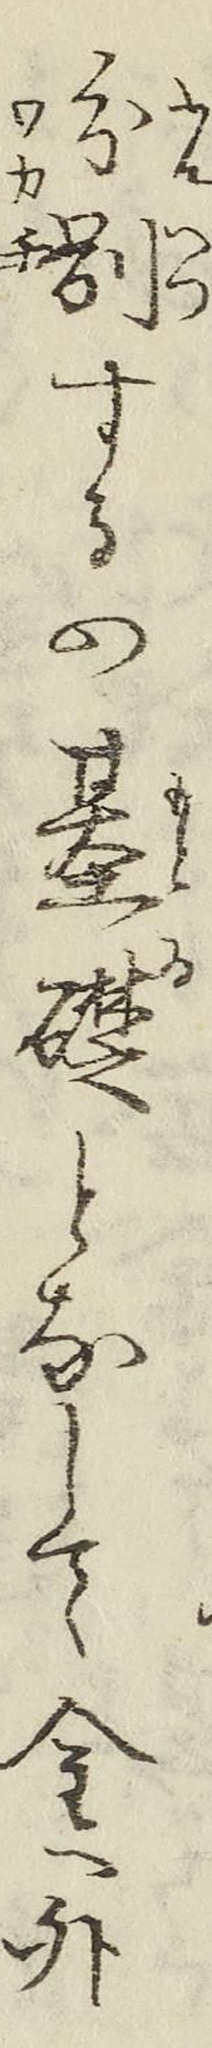分別するの基礎となして金へ外
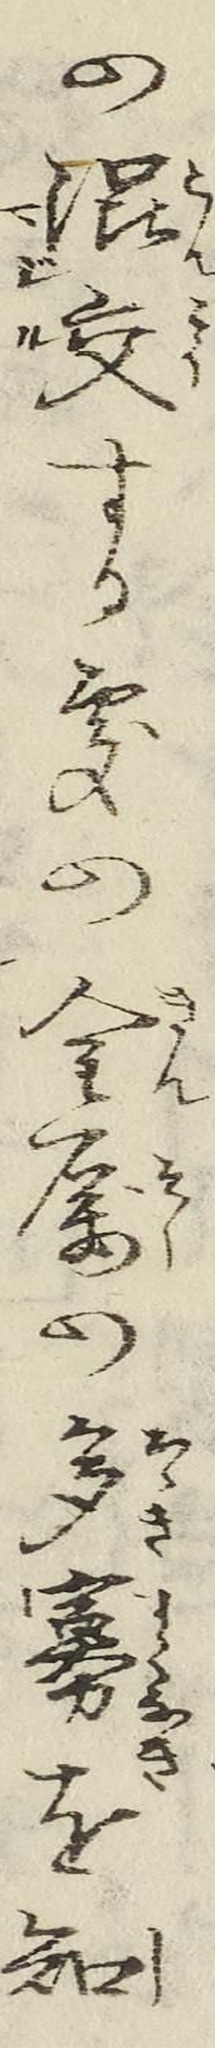の混交する処の金属の多寡を知
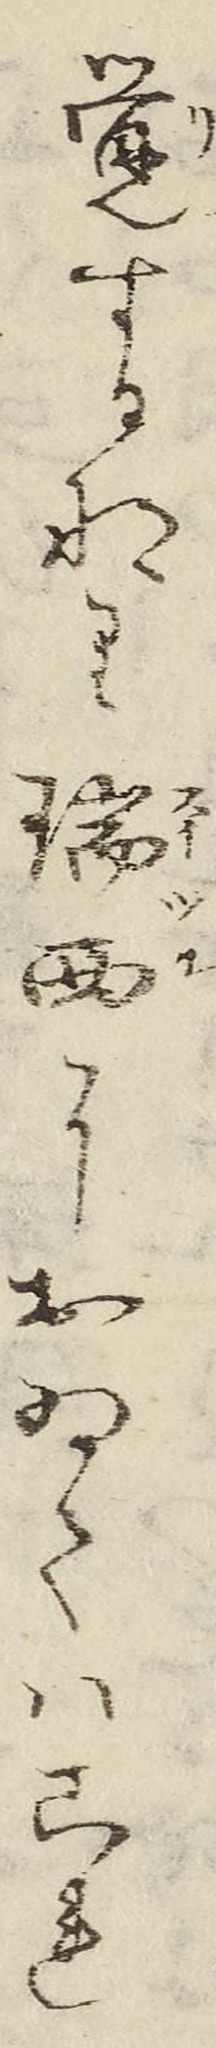覚するなり瑞西におゐてはこれ
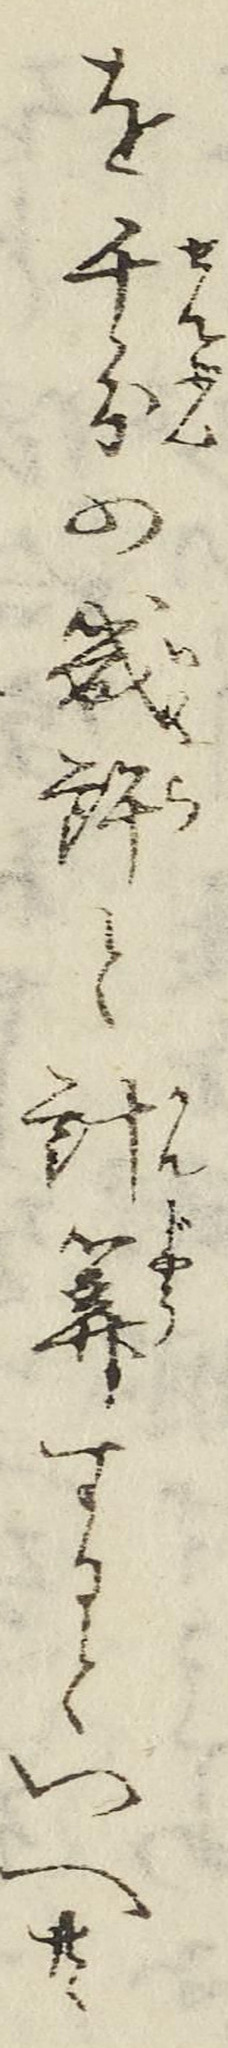を千分の幾許と計算するといへ共
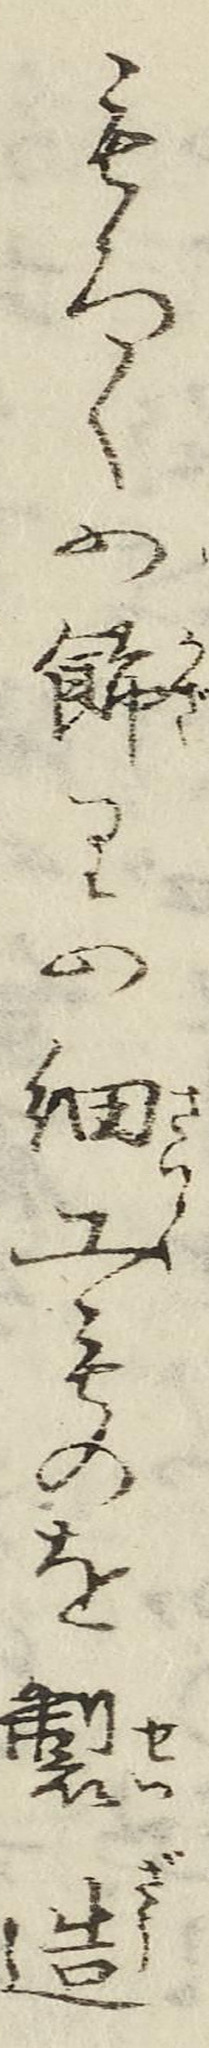もろ〳〵の飾りの細工ものを製造
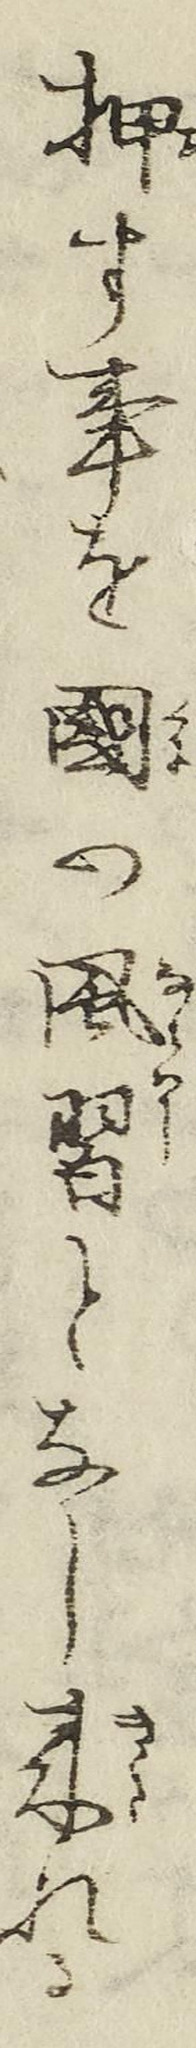押す事を国の風習となし来れる
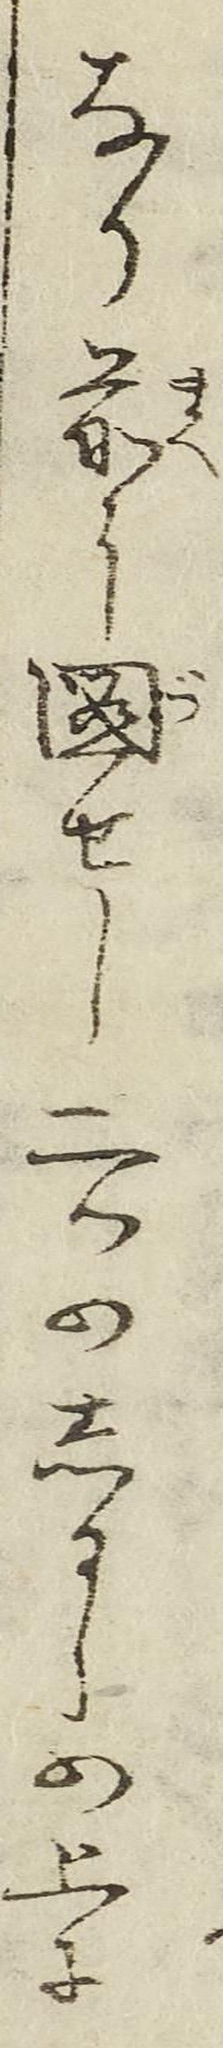なり前に図せし二つのしるしの上に

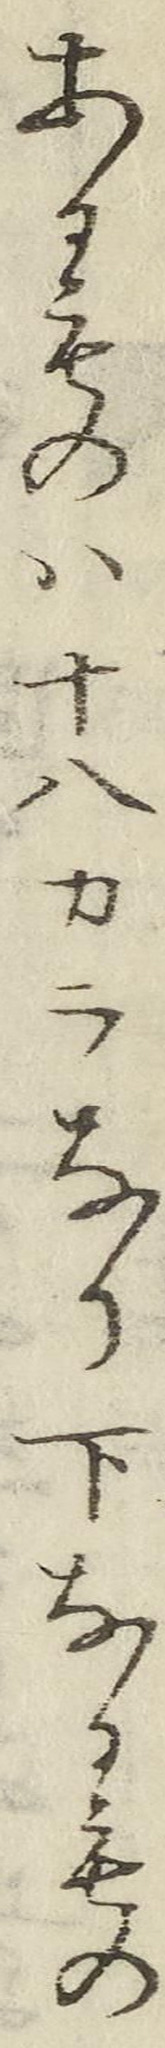あるものは十八カラなり下なるもの
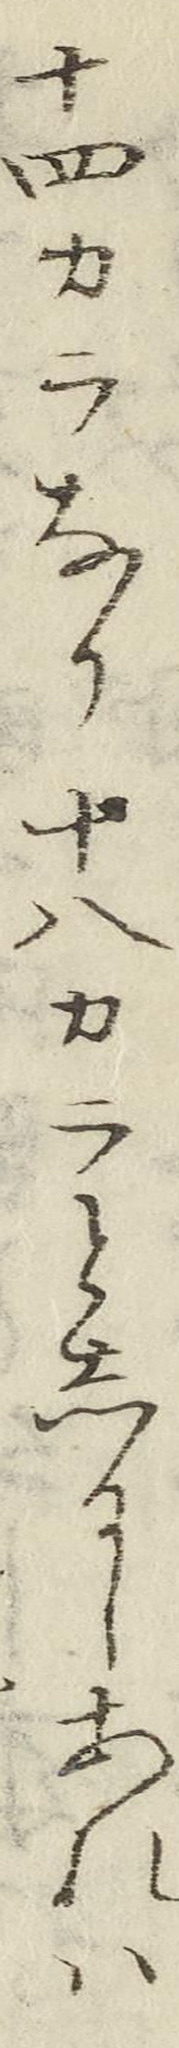十四カラなり十八カラとしるしあれは
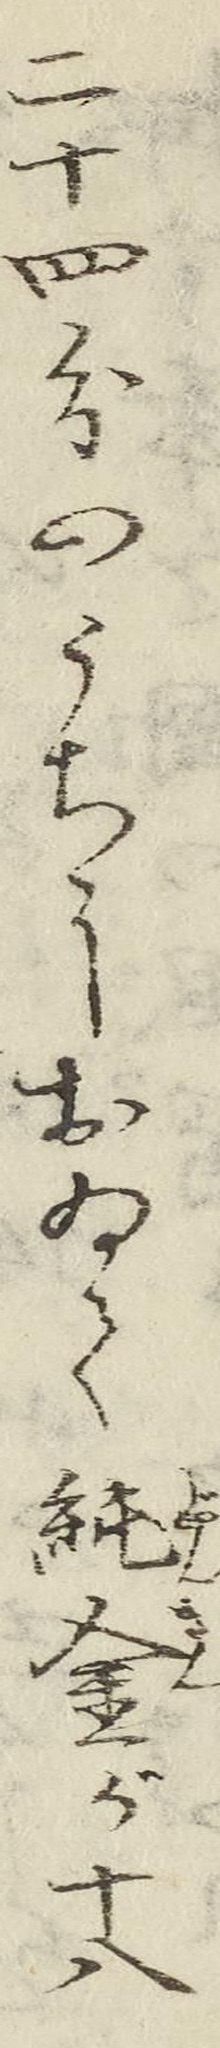二十四分のうちにおゐて純金が十八
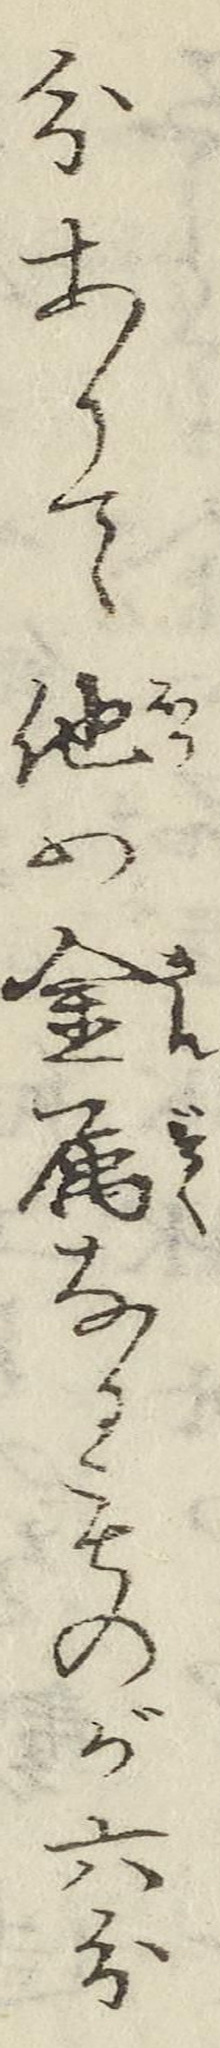分ありて他の金属なるものが六分
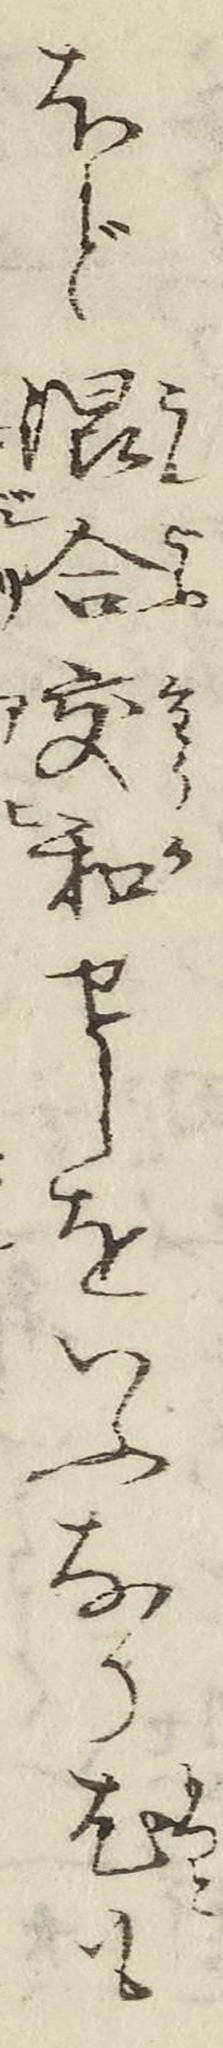など混合交和せしをいふなり尤も
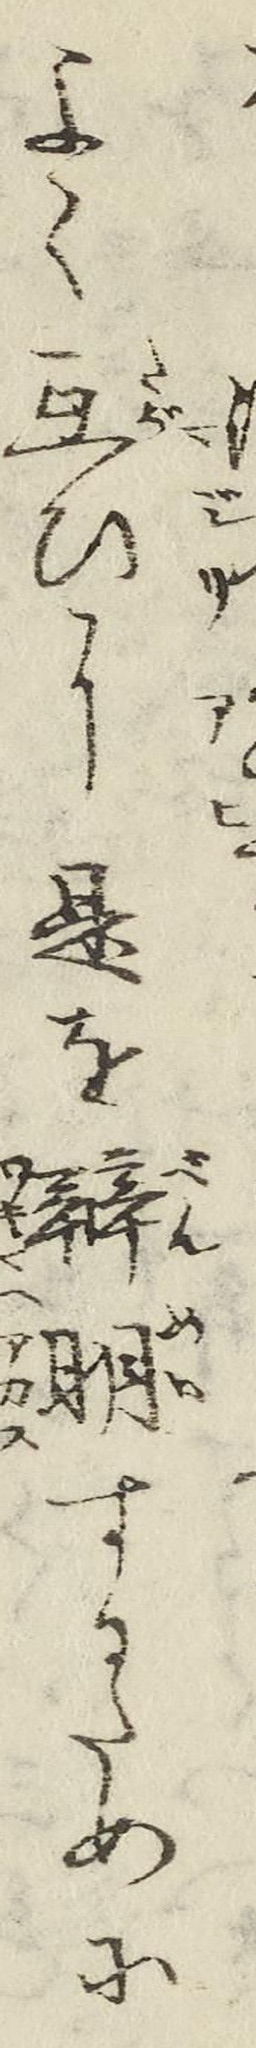よく互ひに是を弁明するために
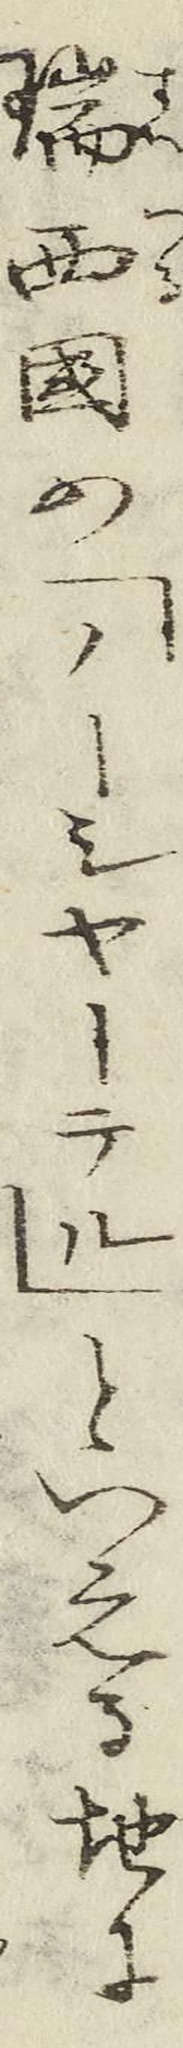瑞西国の「ノーシヤーテル」といえる地に
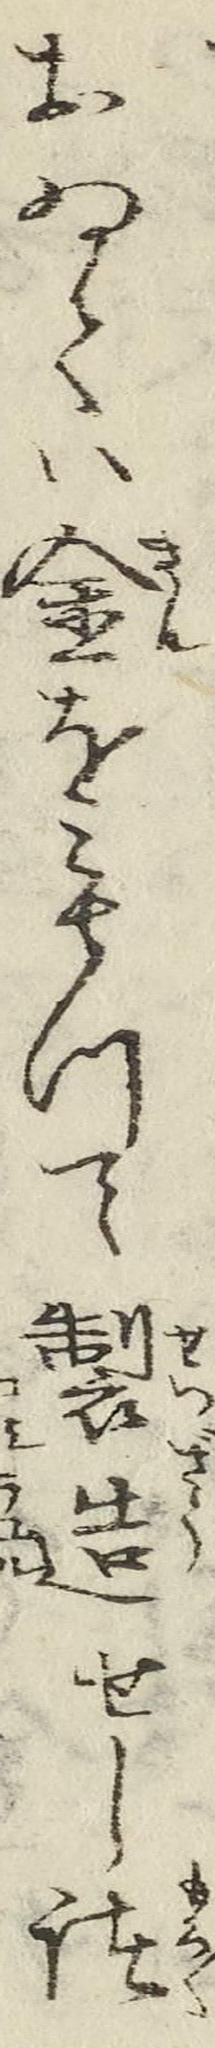おゐては金をもつて製造せし諸
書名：[時計に関する冊子]
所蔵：東京大学地震研究所図書室 Earthquake Research Institute Library, The University of Tokyo, JAPAN
